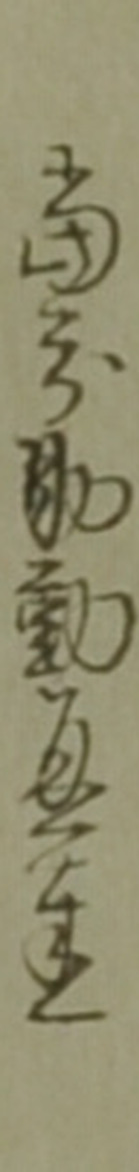当分助勤通達
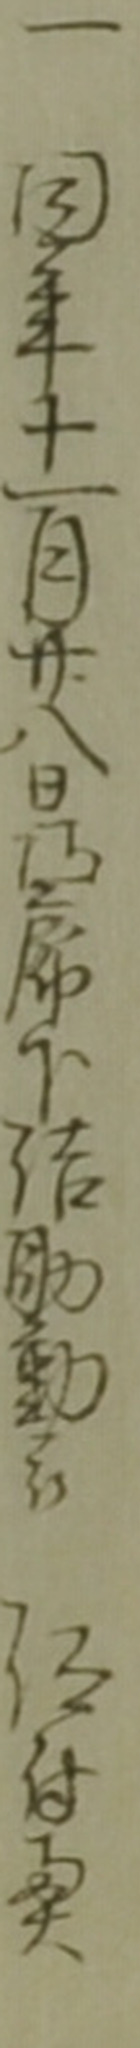一同年十一月廿八日御廊下詰助勤被仰付奥
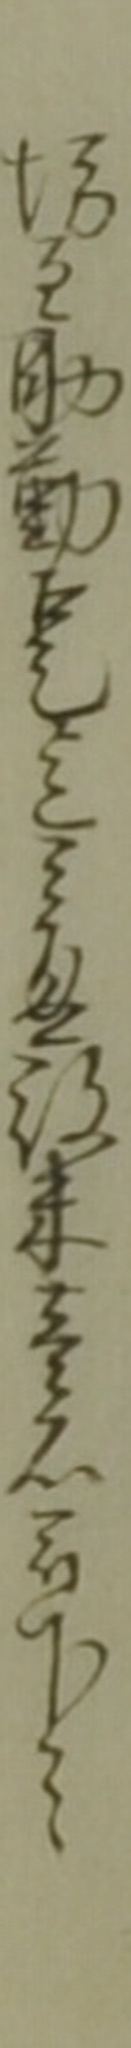坊主助勤是迄之通役米壱石被下之
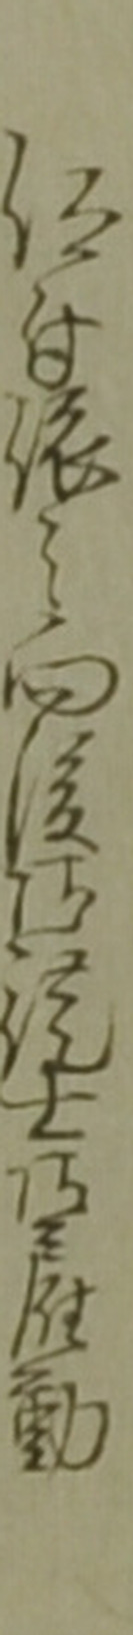仰付依之向後御徒士御雇勤
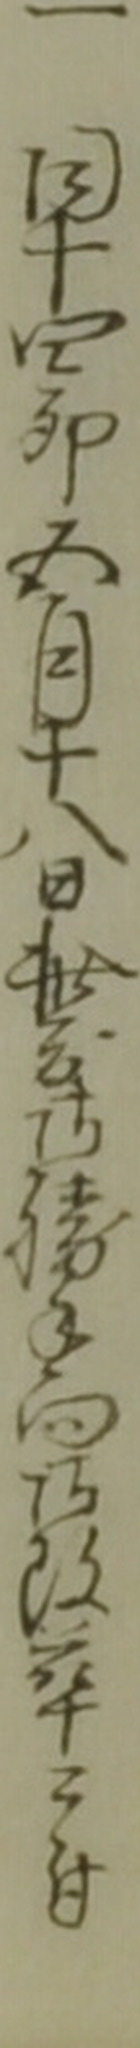一同十四卯五月十八日此度御勝手向御改革ニ付
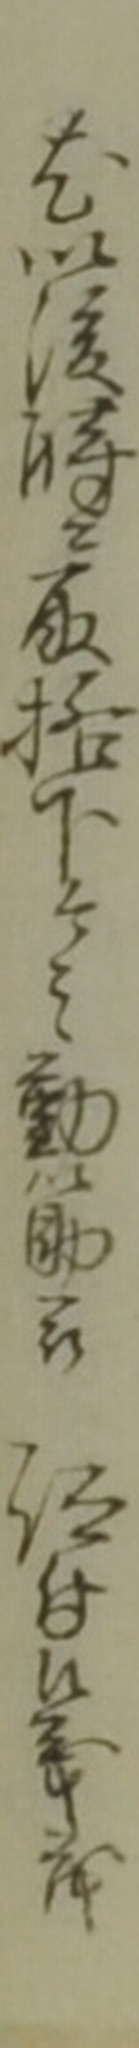尤以後時ニ取格下ヶ之勤筋被仰付候義茂
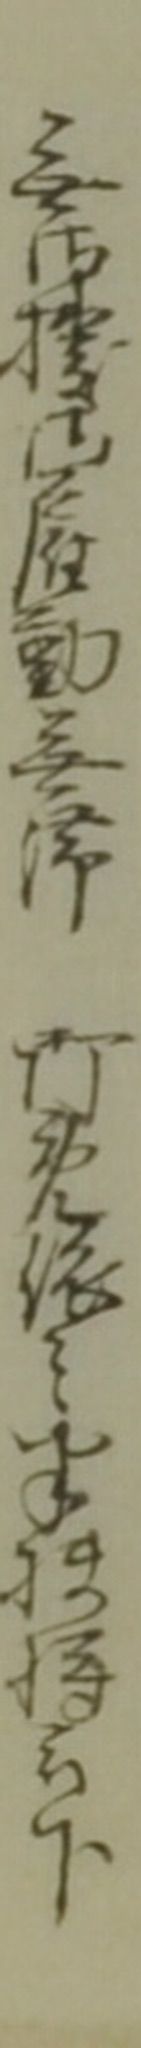無御拠御雇勤無滞御免依之半扶持被下
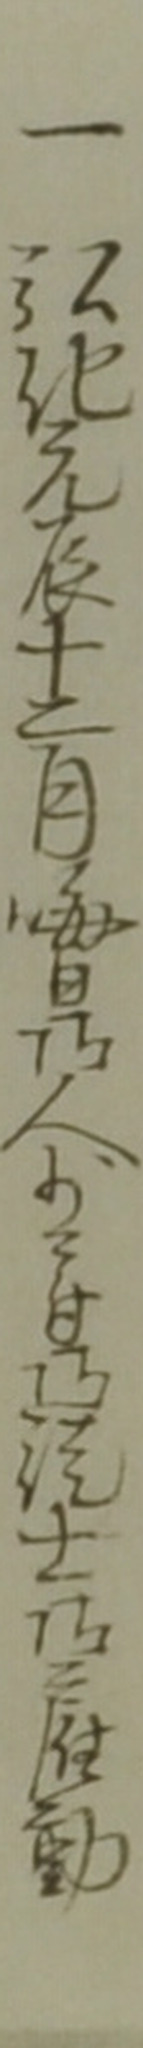一弘化元辰十二月晦日御人少ニ付御徒士御雇勤
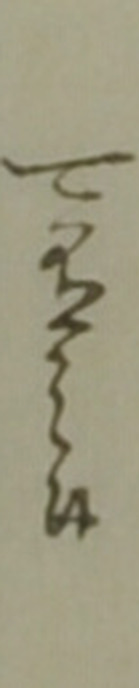可有之候
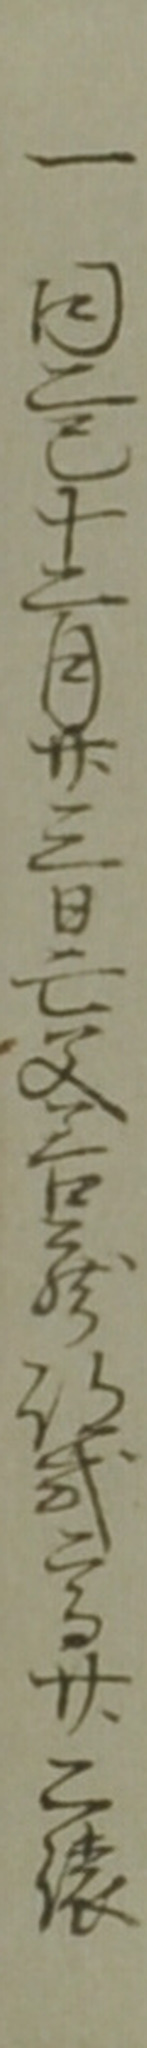一同二巳十二月廿三日亡父善蔵跡式高廿二俵
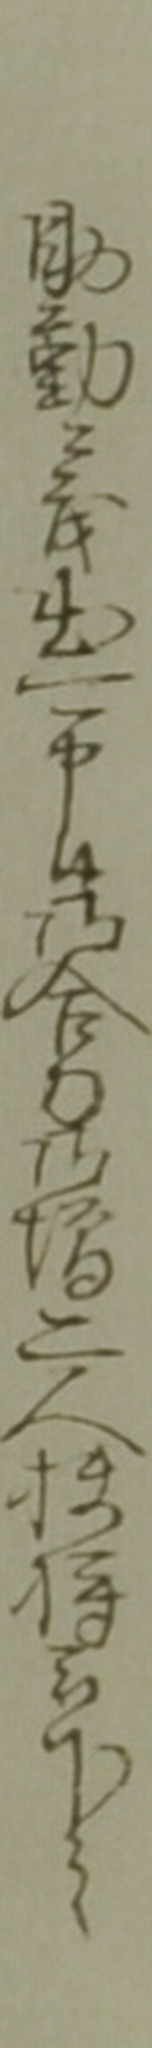助勤ニ茂出可申御合力御増二人扶持被下之
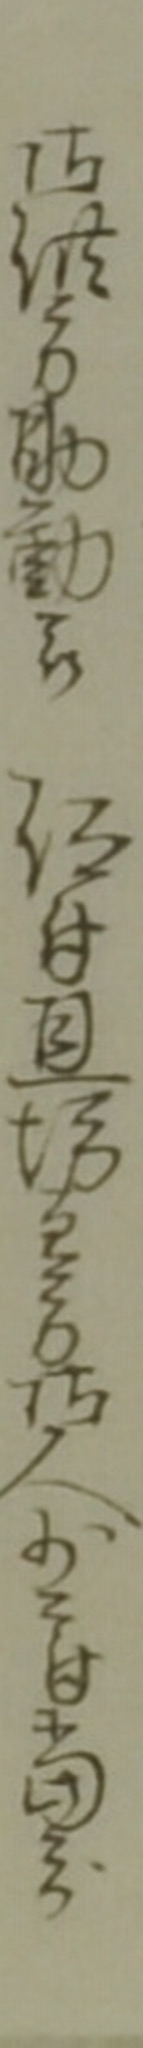御供方助勤被仰付且坊主方御人少ニ付当分
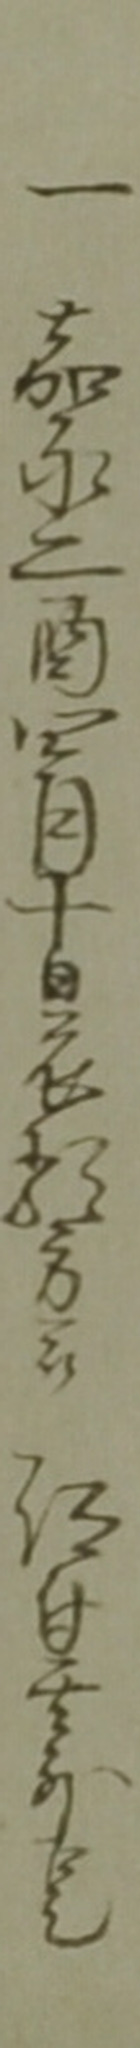一嘉永二酉四月十日衣類方被仰付其外是
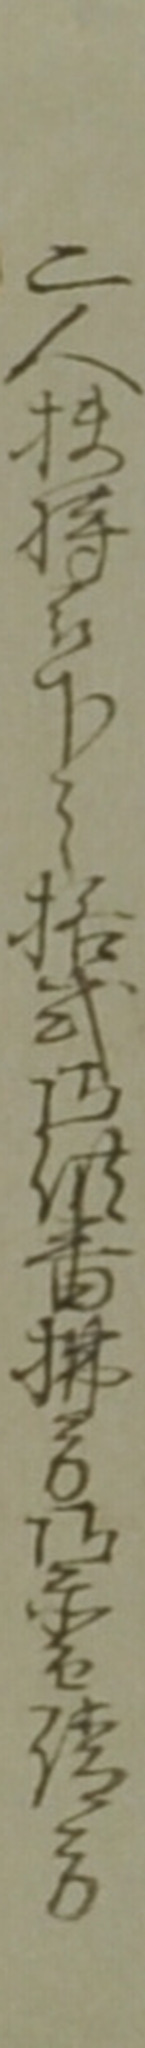二人扶持被下之格式御供番払方御普請方
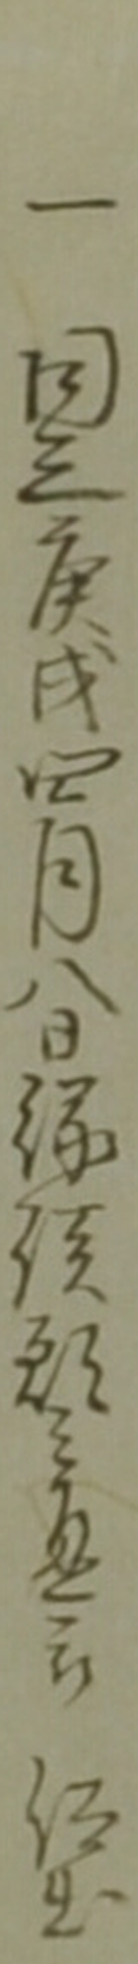一同三庚戌四月八日縁談願之通被仰出
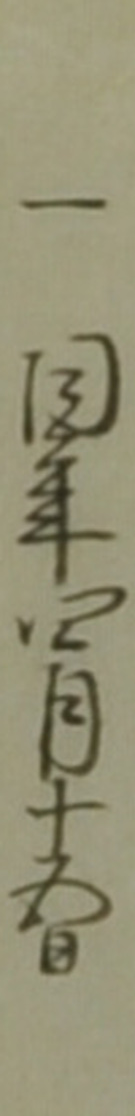一同年四月十五日
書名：無足諸士勤仕録（二）
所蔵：伊那市立高遠町図書館・合同会社AMANE
